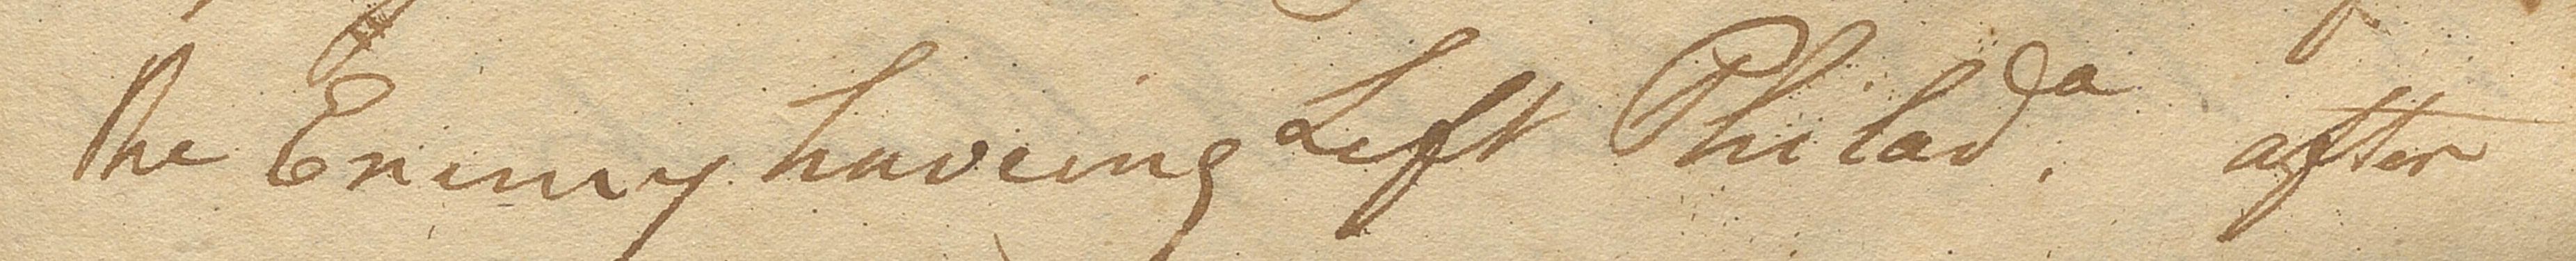the Enemy haveing Left Philad^a. after
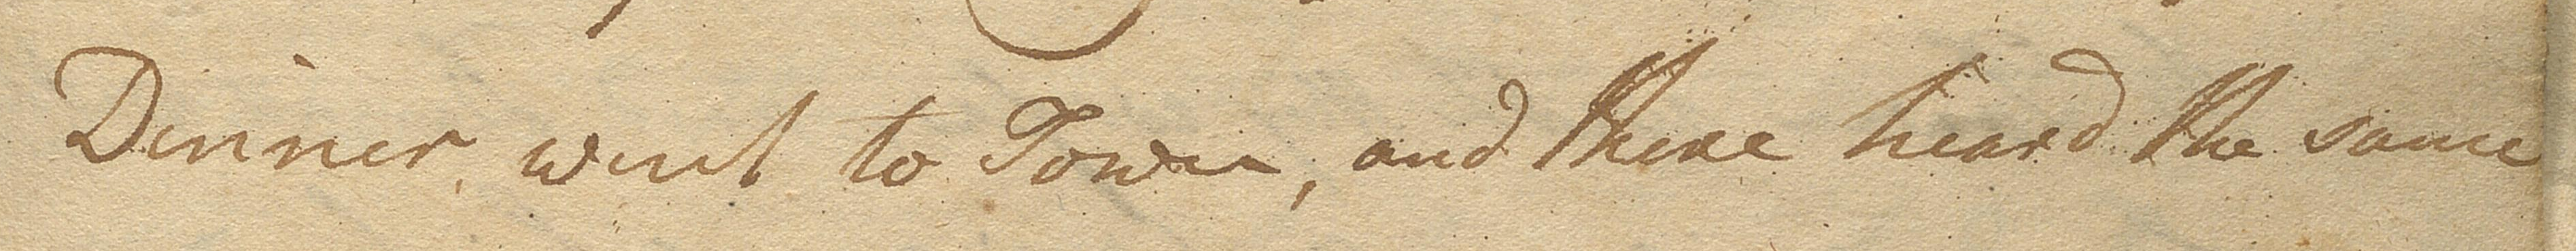Dinner went to Town and there heard the same
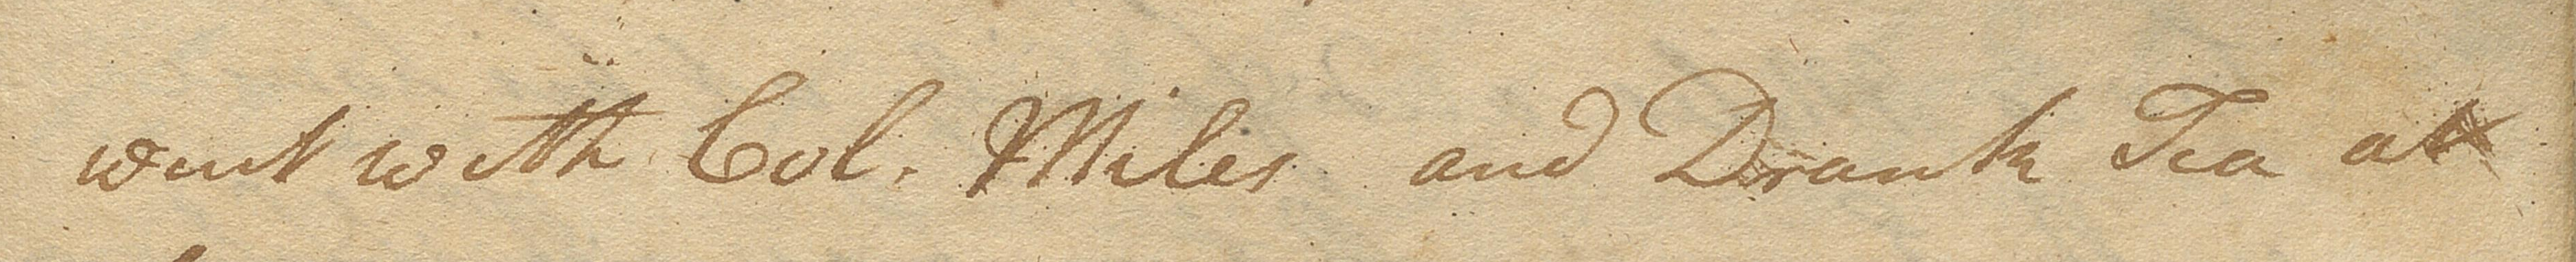went with Col. Miles and Drank Tea at
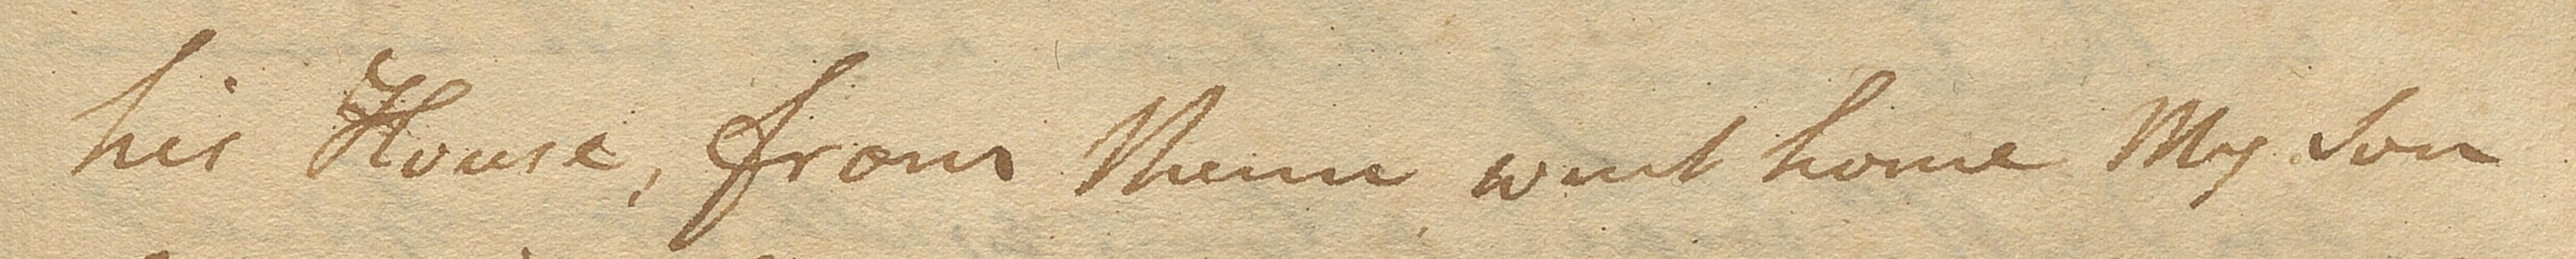his House, from thence went home My Son
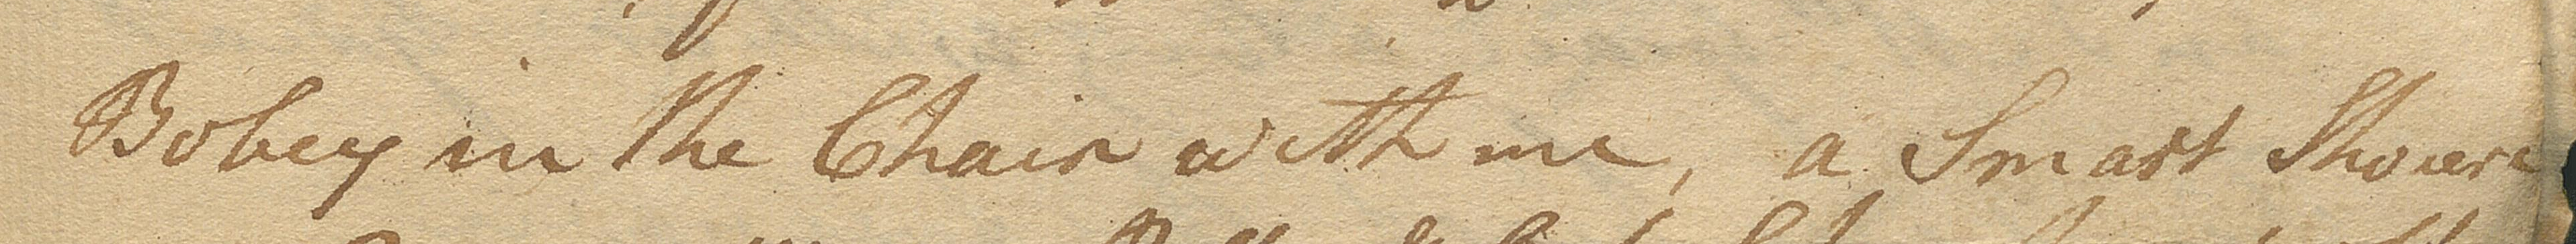Bobey in the Chair with me, a Smart Shoure
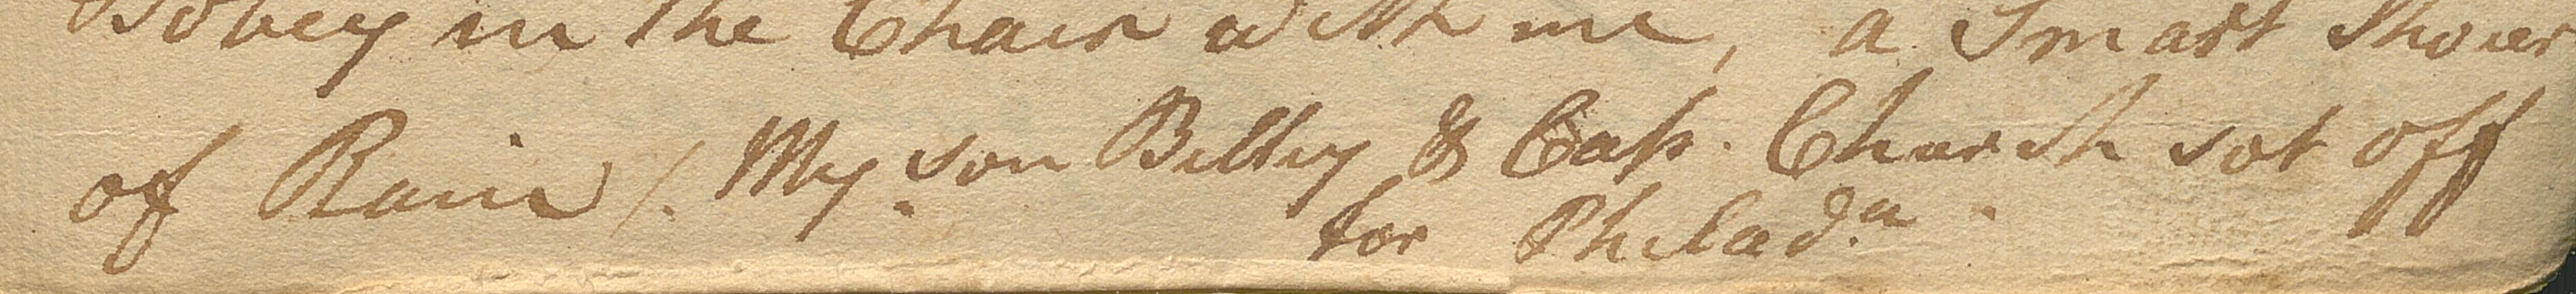of Rain My son Billey & Cap. Church set off
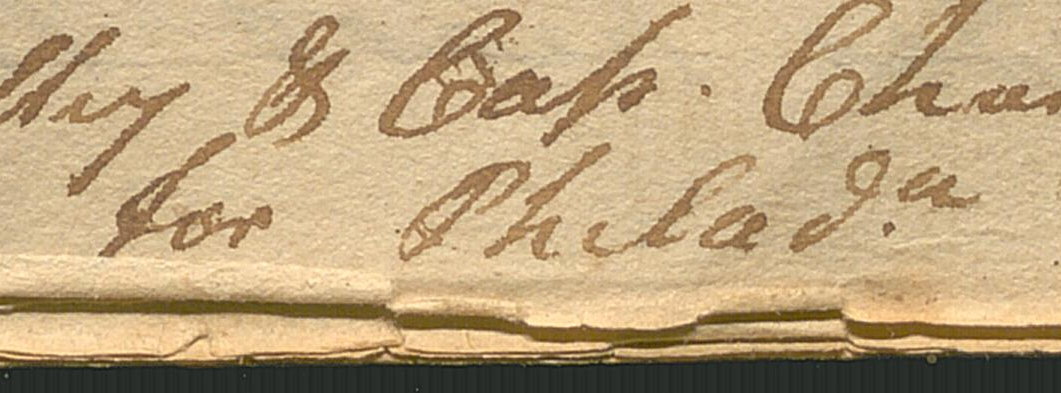for Philad^a.
